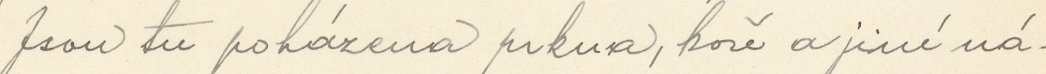Jsou tu poházena prkna, koše a jiné ná-
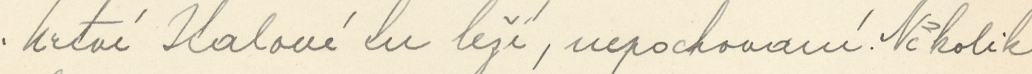Mrtví Italové tu leží, nepochovaní. Několik
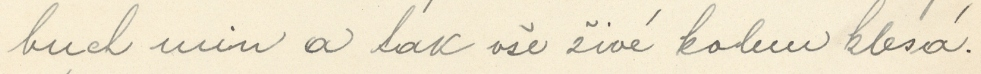buch min a tak vše živé kolem klesá.
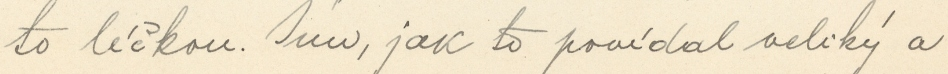to léčkou. Inu, jak to povídal veliký a
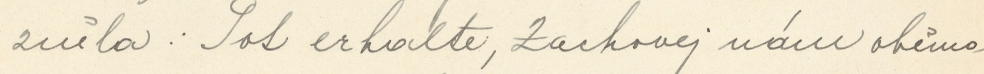zněla: Tot erhalte, zachovej nám oběma
